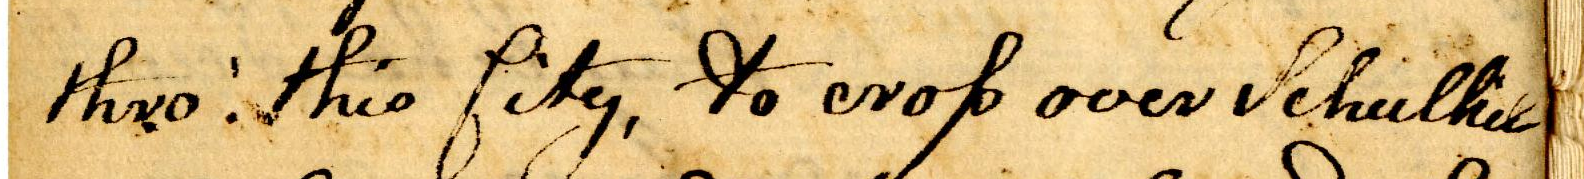thro' this City, to cross over Schulkil
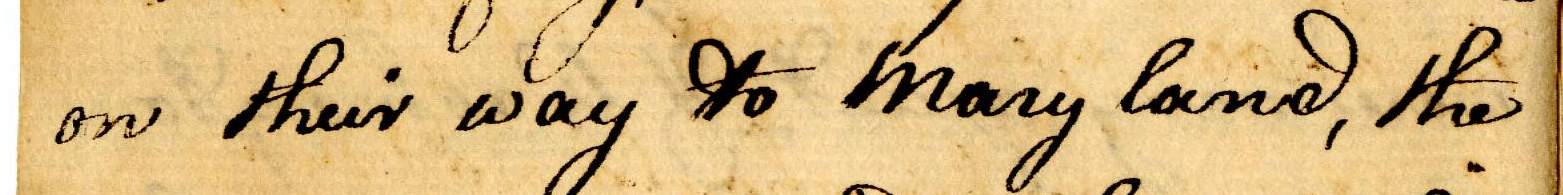on their way to Mary land, the
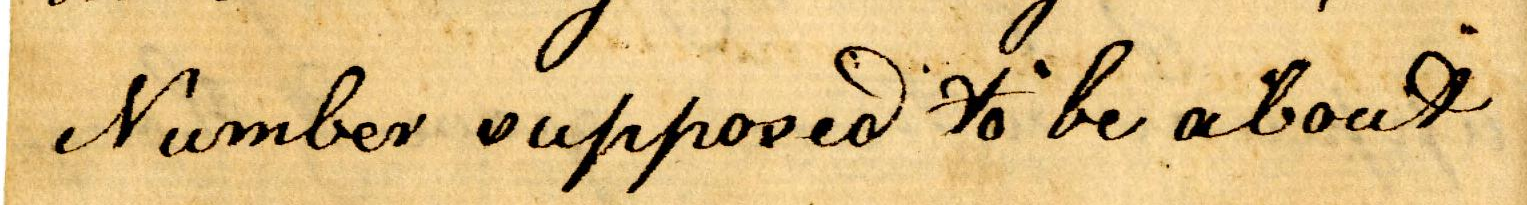Number supposed to be about
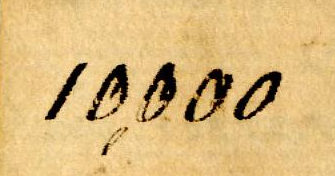10,000-
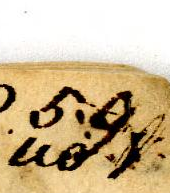59
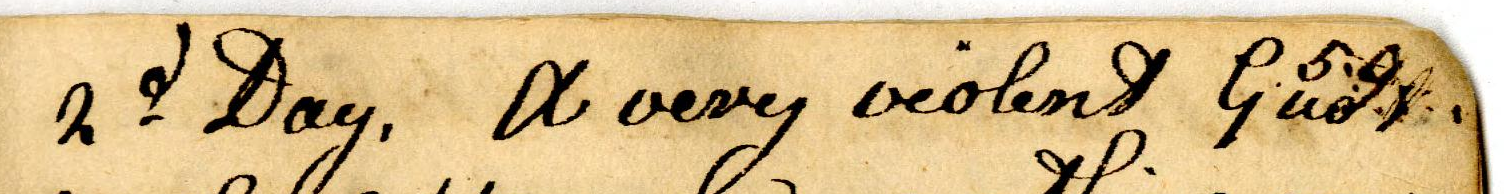2^d Day, A very violent Gust
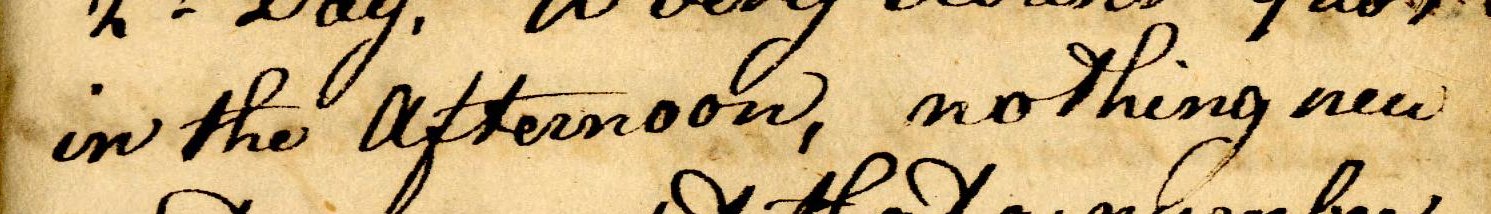in the Afternoon, nothing new
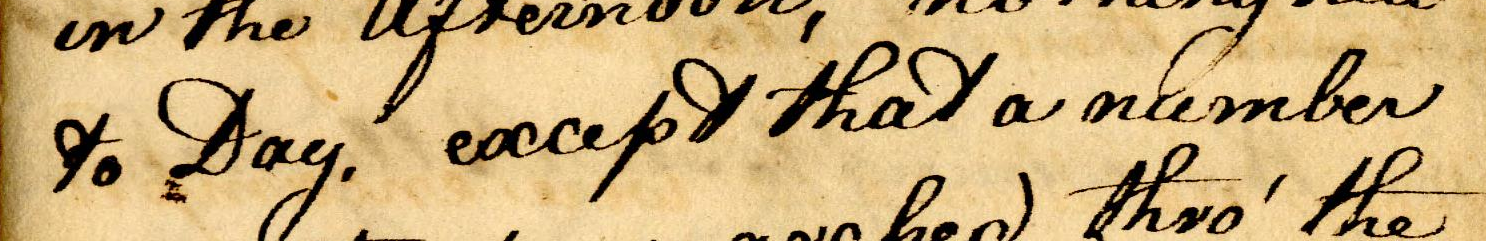to Day. except that a number
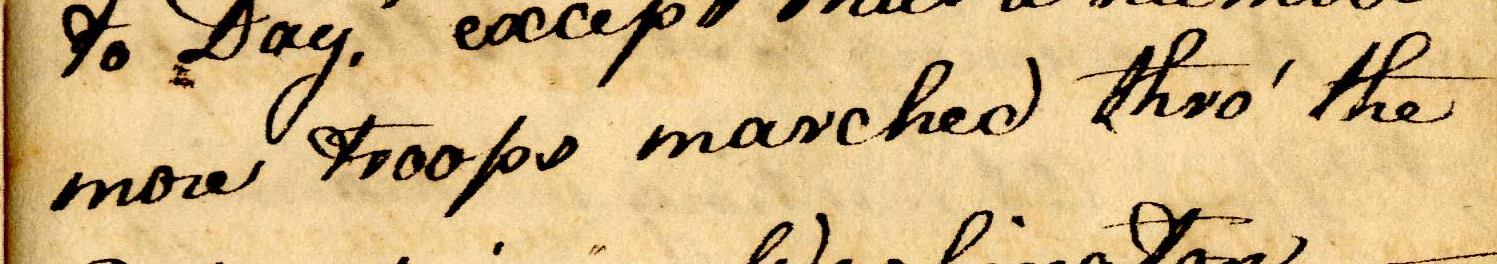more troops marched thro' the
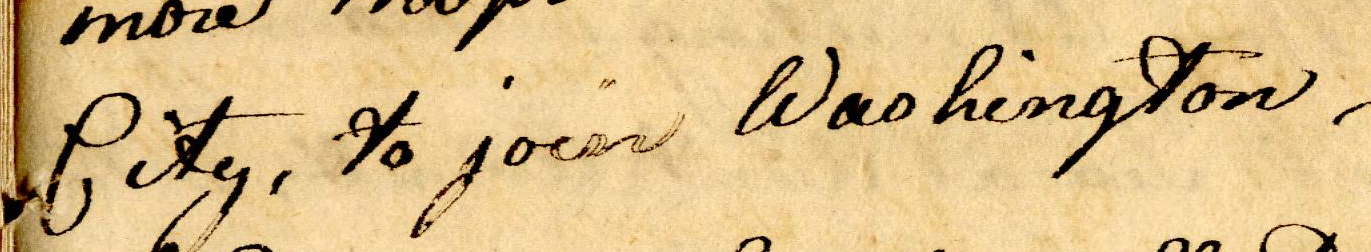City, to join Washington-
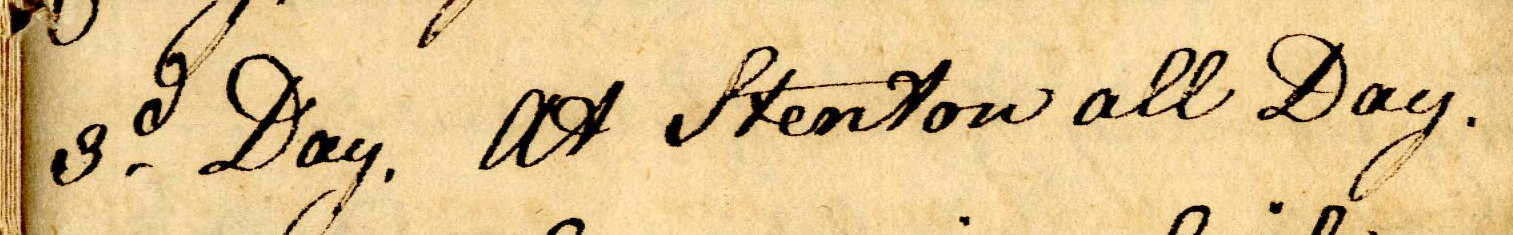3^d Day. At Stenton all Day.
